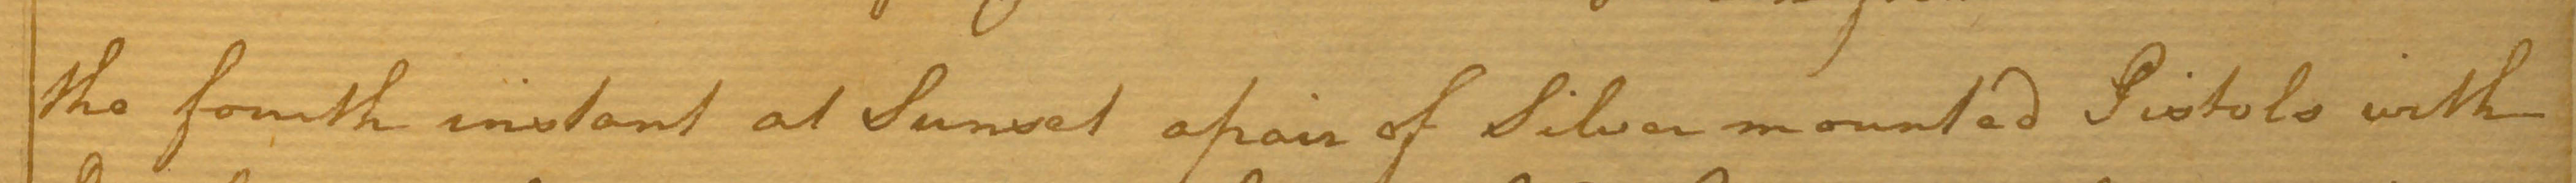the fourth instant at Sunset a pair of silver mounted Pistols with
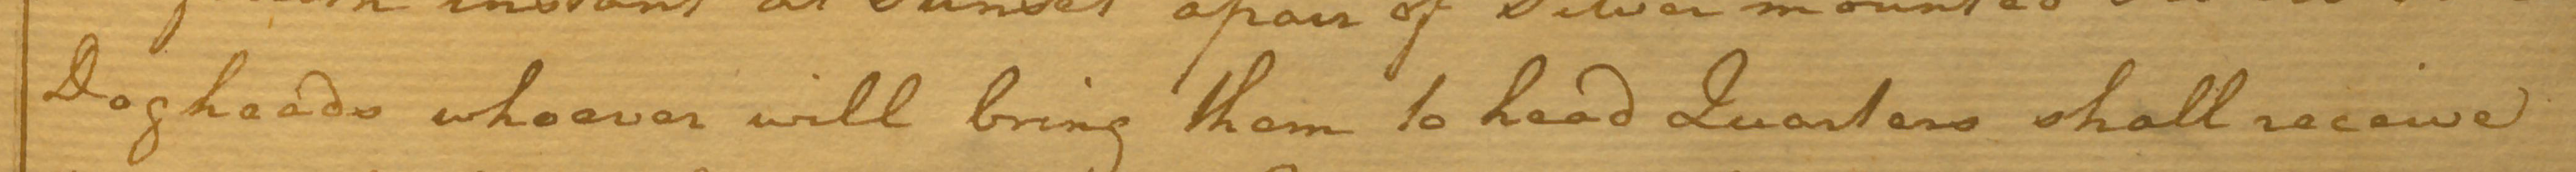Dogheads whoever will bring them to head Quarters shall receive
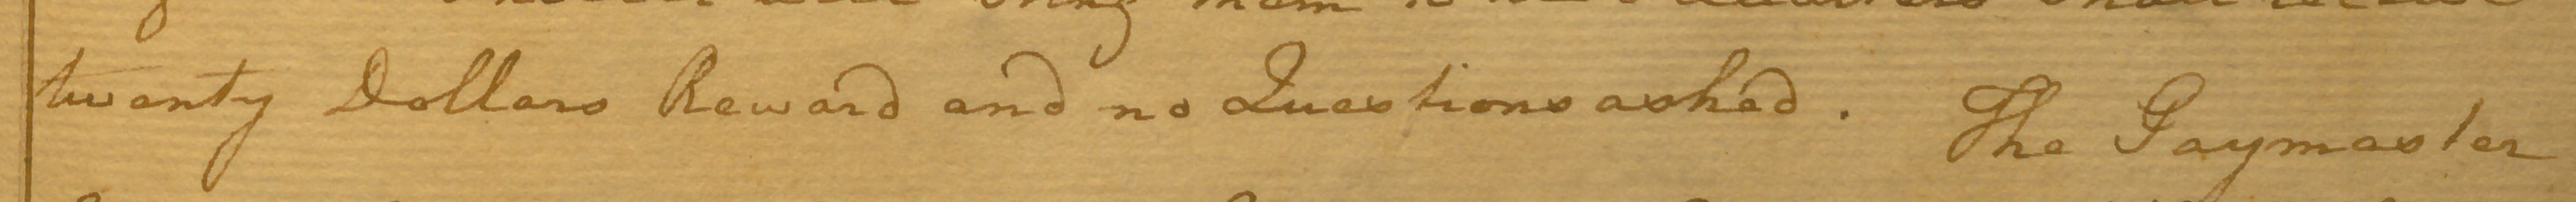twenty Dollars Reward and no Questions asked. The Paymaster
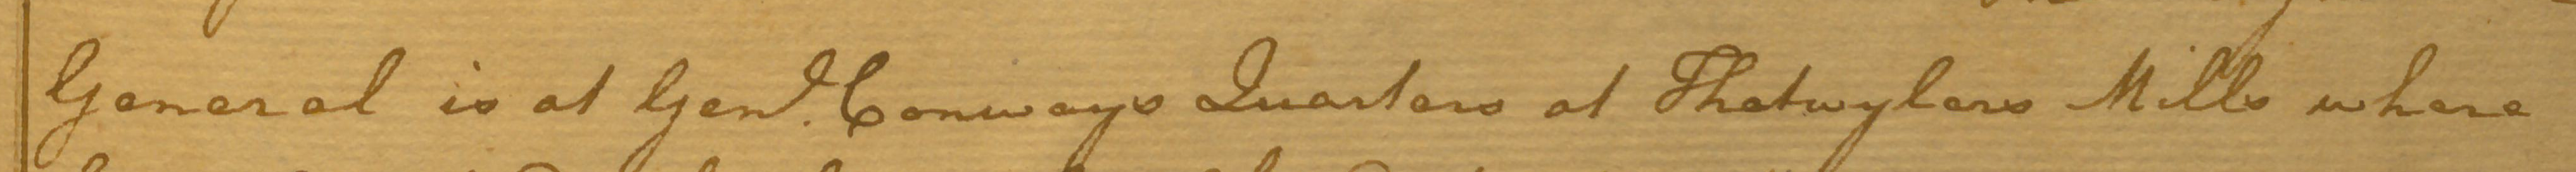General is at Gen^l. Conways Quarters at Thatwylers Mills where
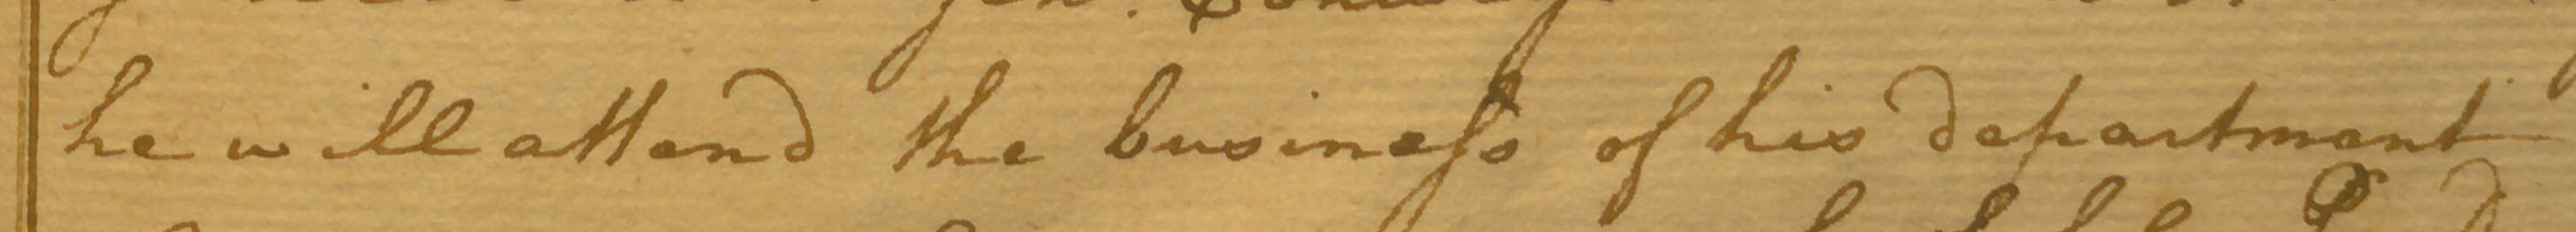he will attend the business of his department
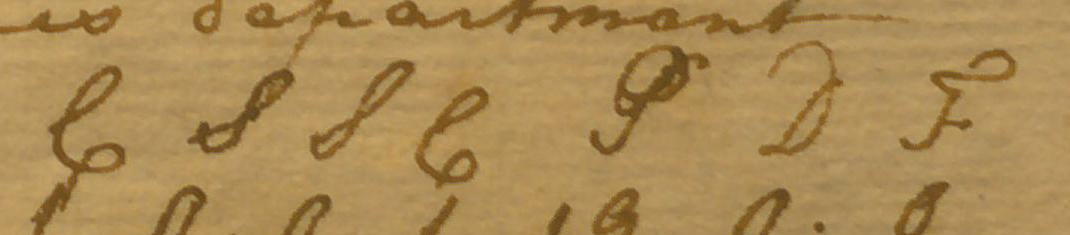C S S C P D F
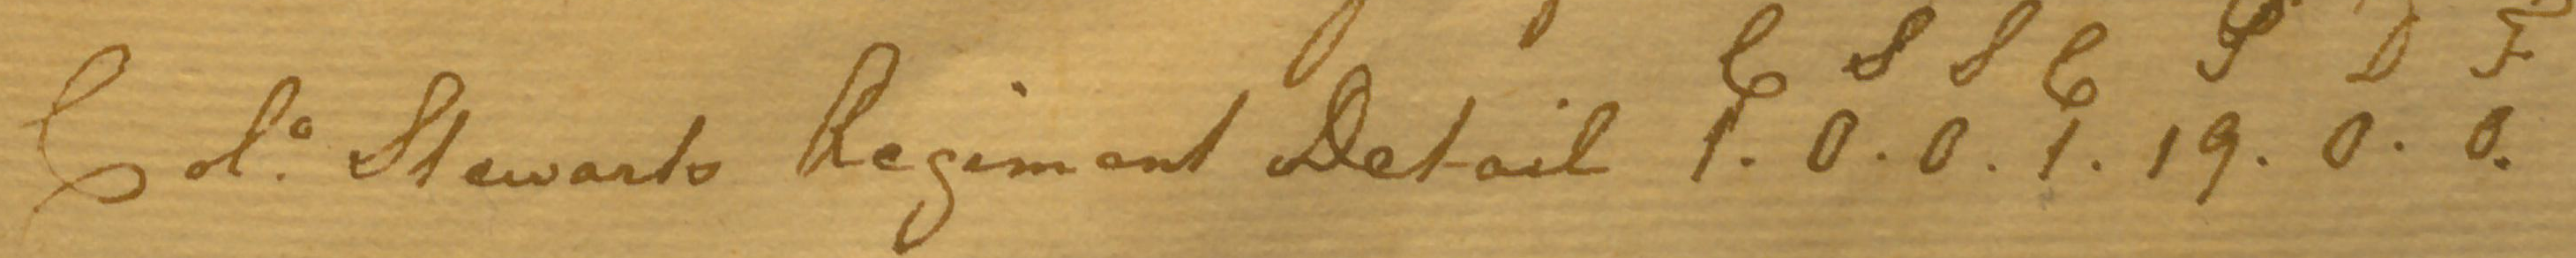Col^o. Stewarts Regiment Detail 1. 0. 0. 1. 19. 0. 0.
